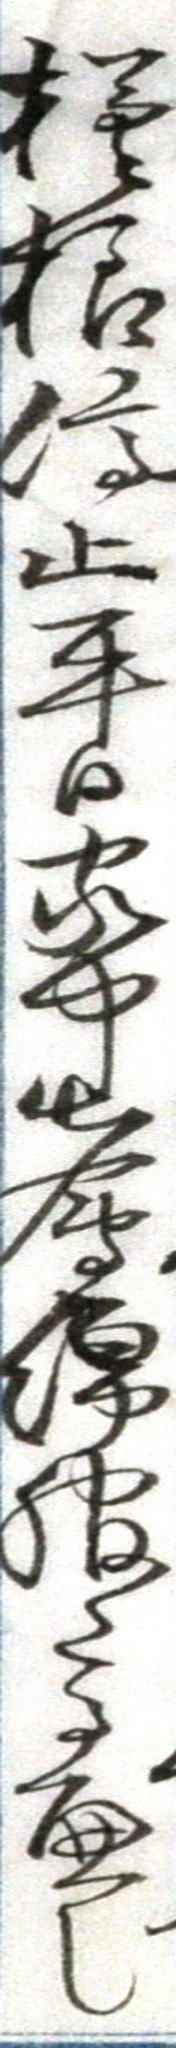模様停止平日家中出会綿服たるへし
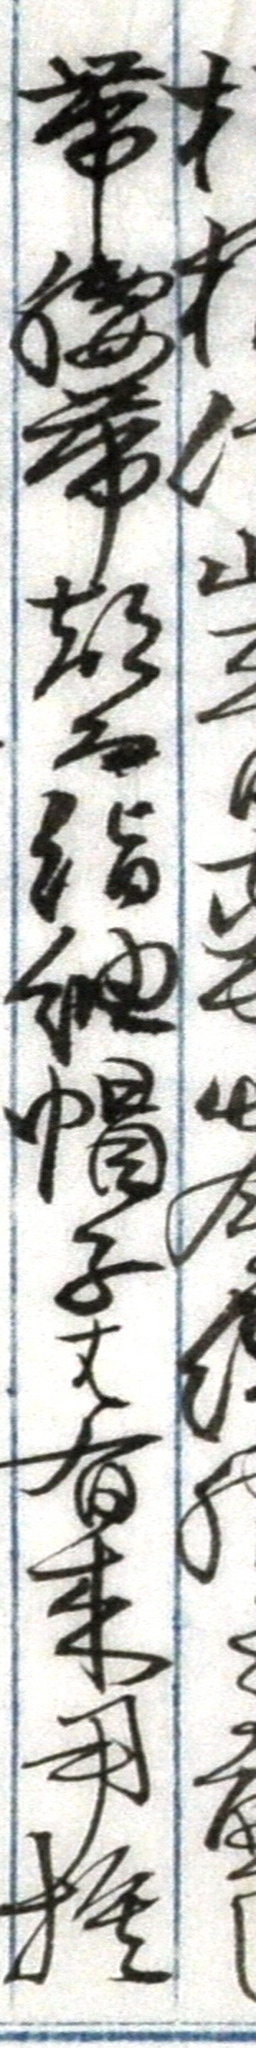帯腰帯都而絹紬帽子は有来用捨
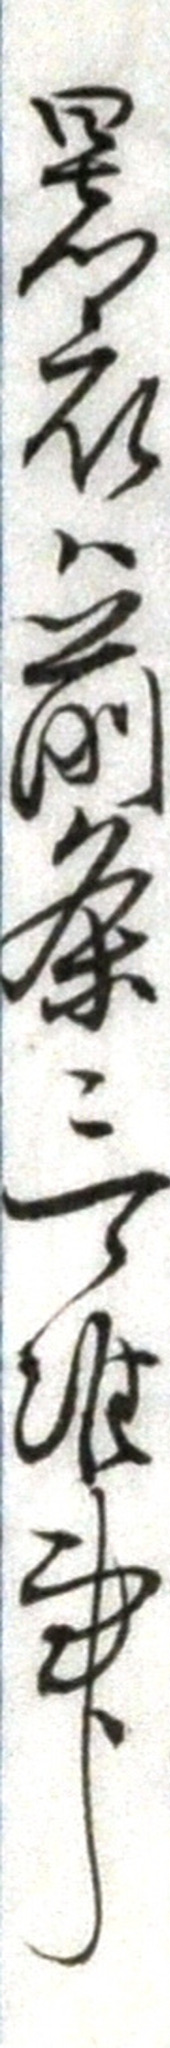暑衣ハ前条ニ可准事
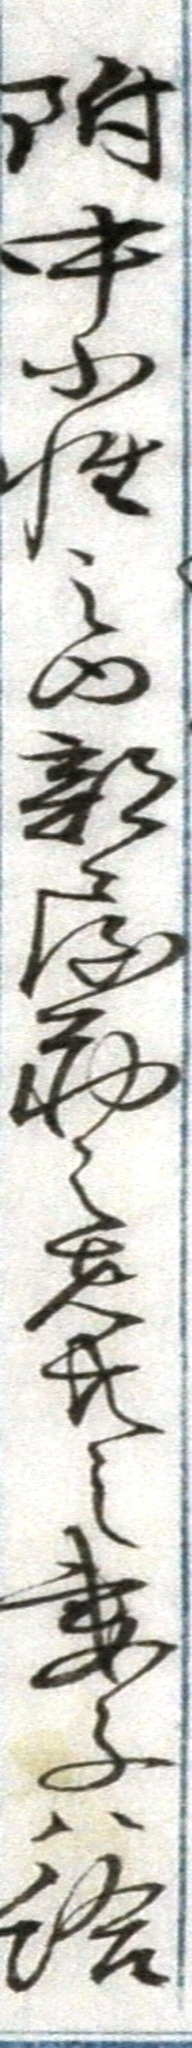附中小性之内部屋勤之者共之妻子ハ給
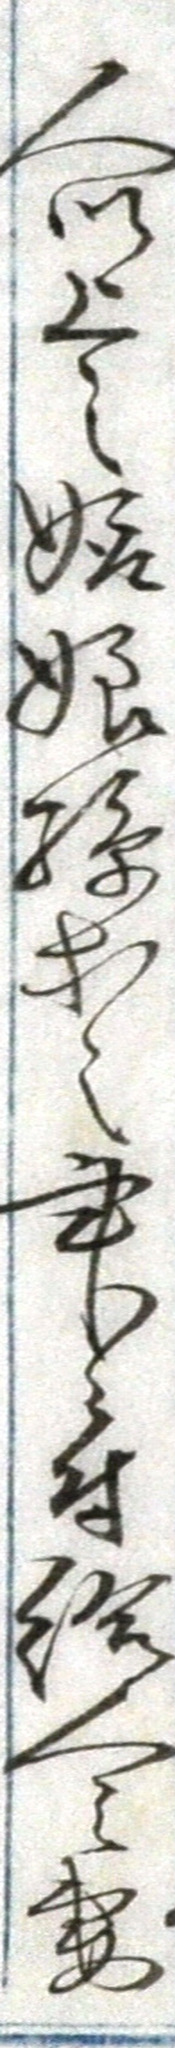人以上之娵娘孫等之事ニ付給人之妻
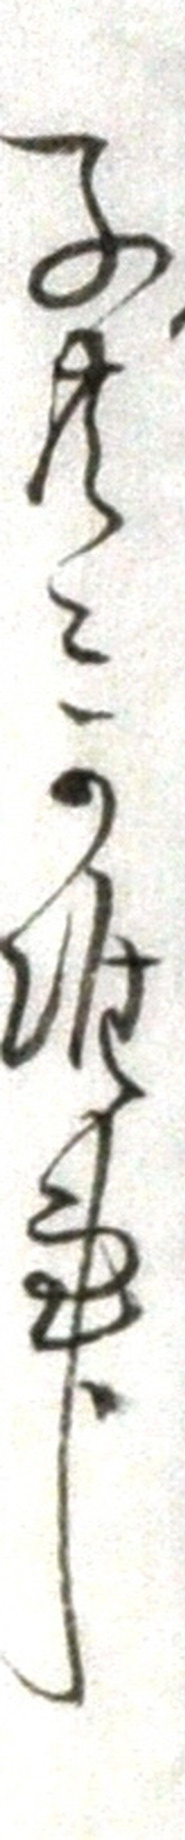子共ニ可准事
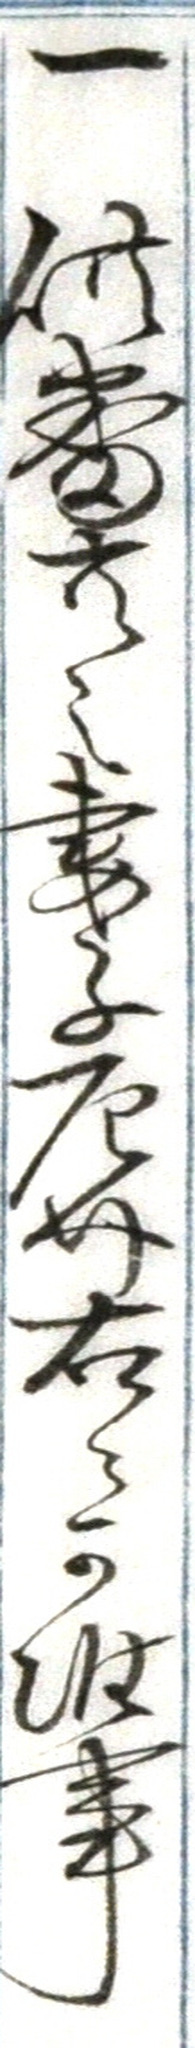一供番共之妻子厄介右ニ可准事

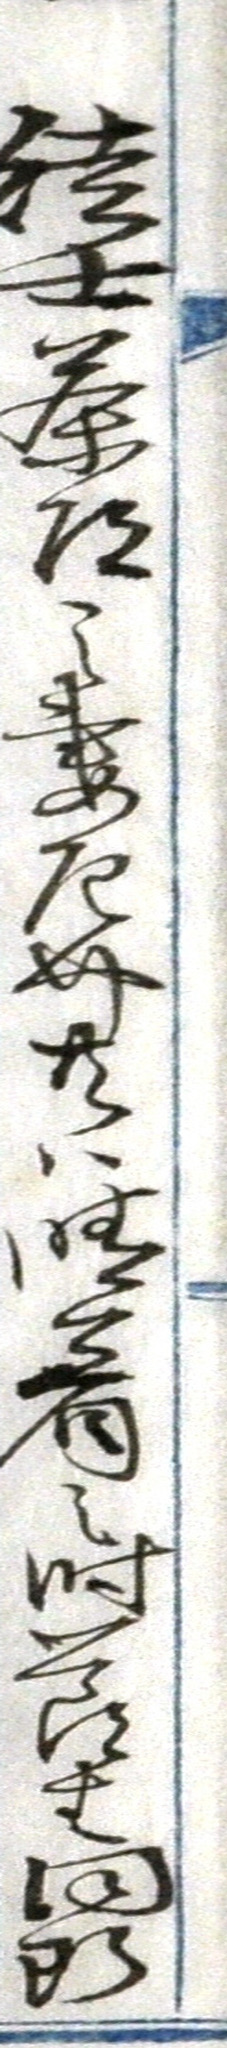一諸士茶道之妻厄介共ハ晴着之時節は同断
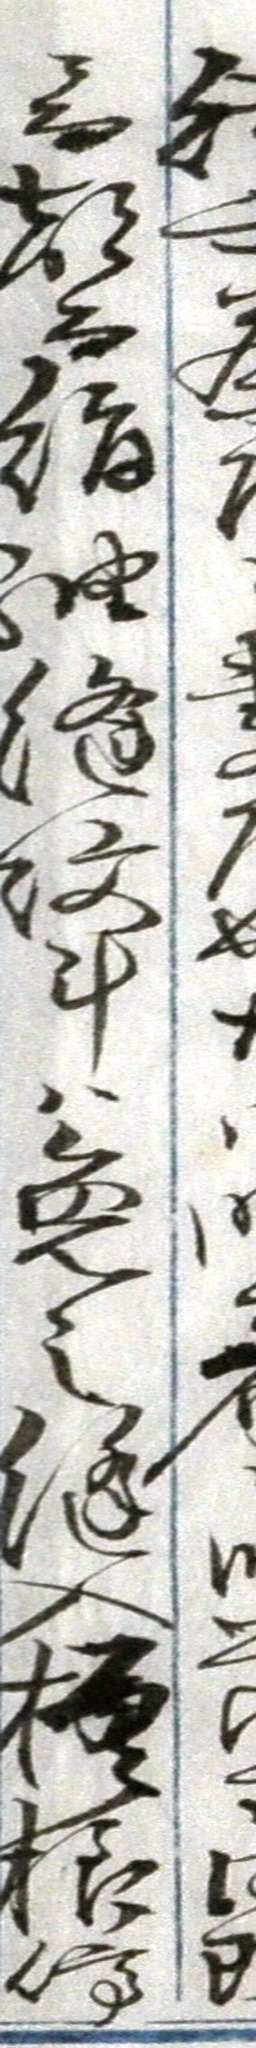ニ而都而絹袖縫紋斗ハ免之縫入模様停
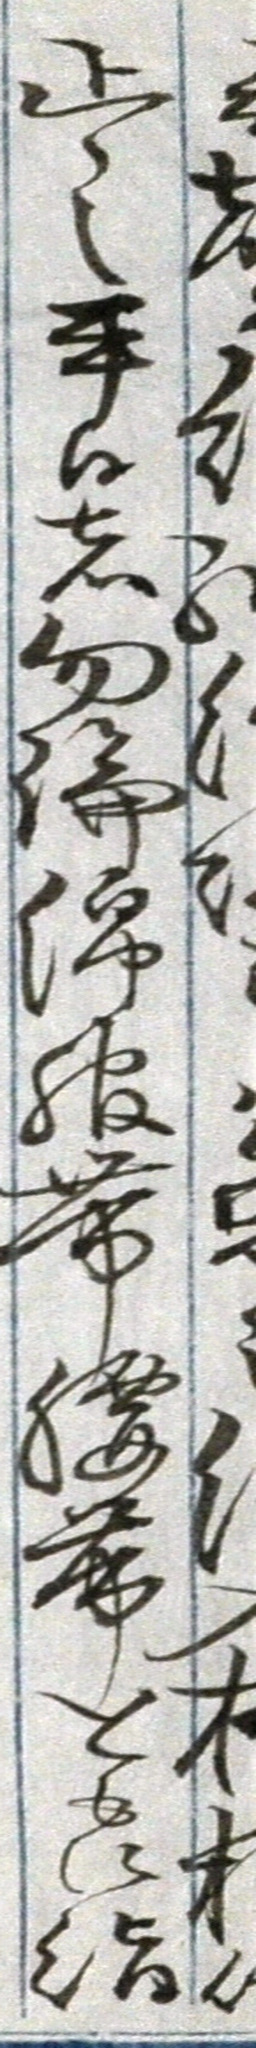止之平日は勿論綿服帯腰帯ともに絹
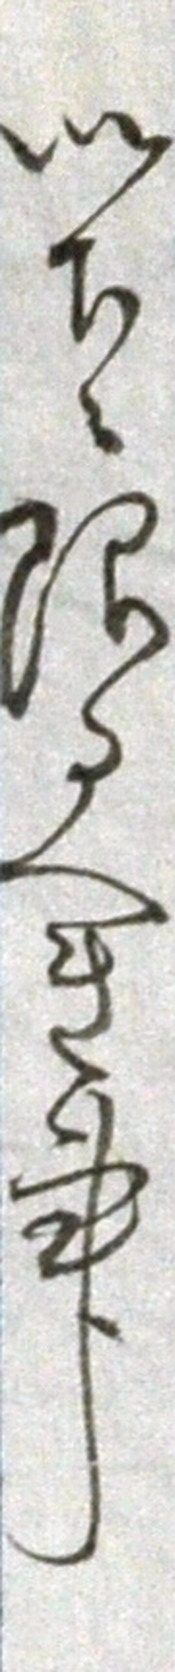以下ニ限るへき事
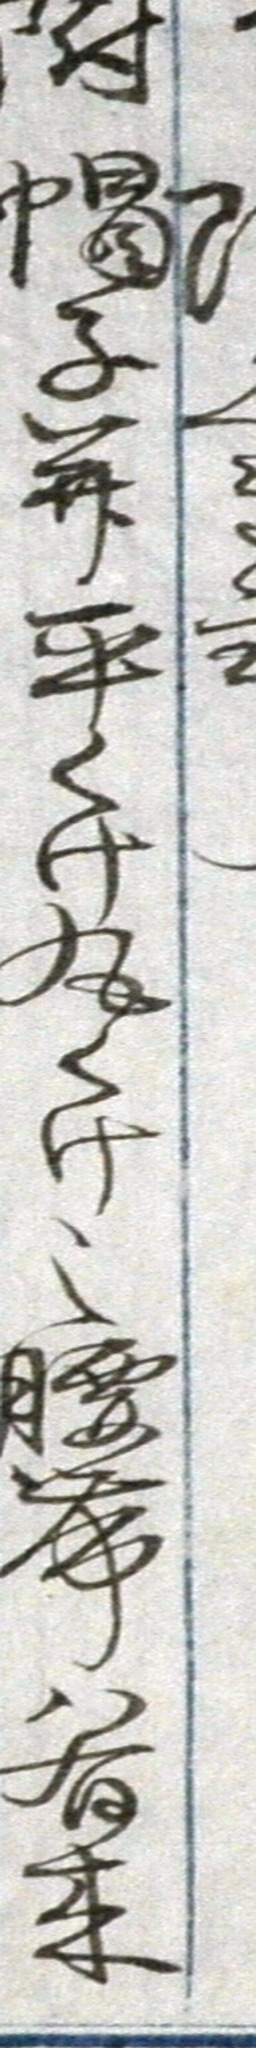附帽子并平くけ丸くけ之腰帯ハ有来
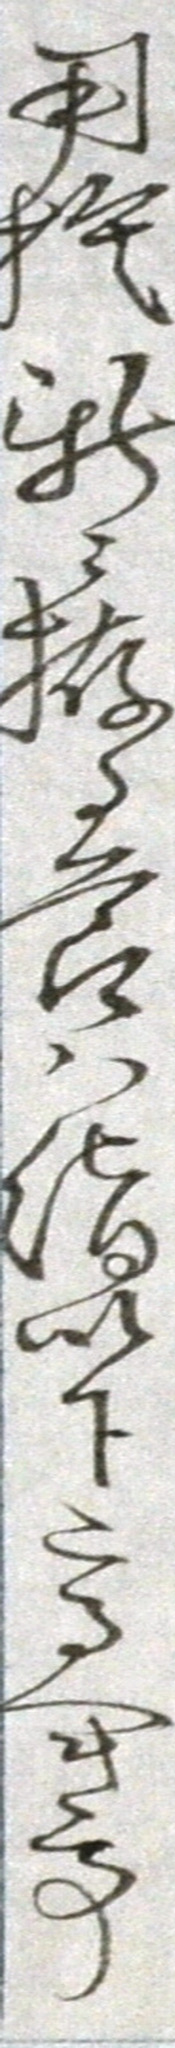用捨新ニ拵る節ハ絹以下たるへき事
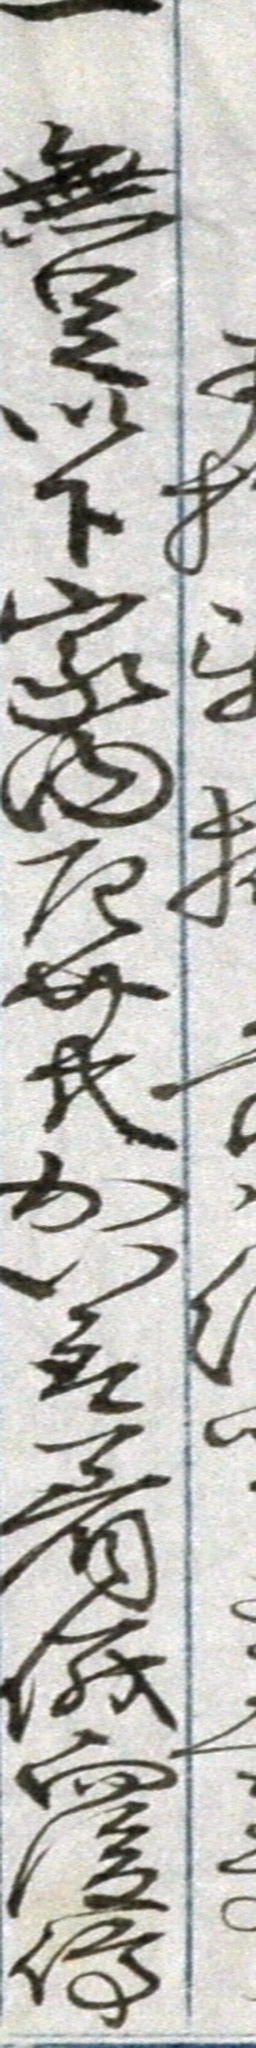一無足以下家内厄介共かい取着儀向後停
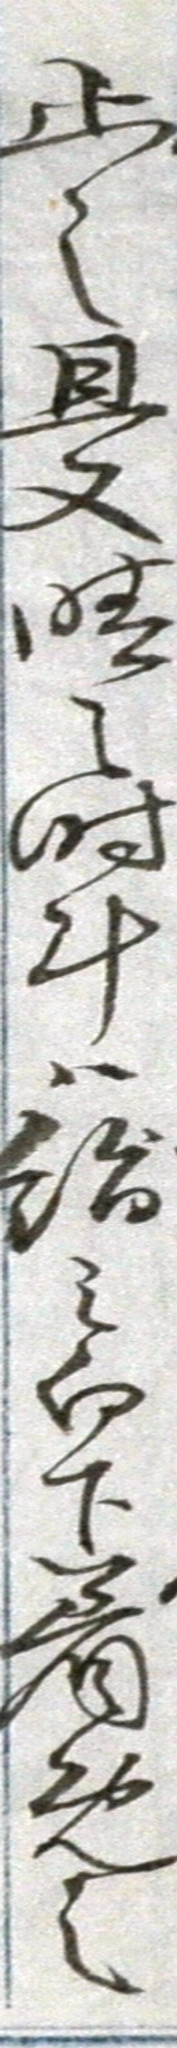止之且又晴之時斗ハ絹之白下着免之
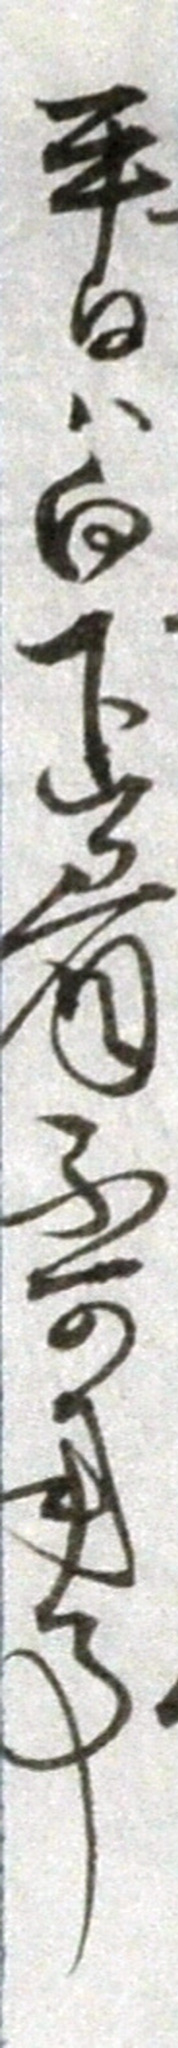平日ハ白下着不可用事
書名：頼由公（源隆院殿）御定
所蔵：伊那市立高遠町図書館・合同会社AMANE
